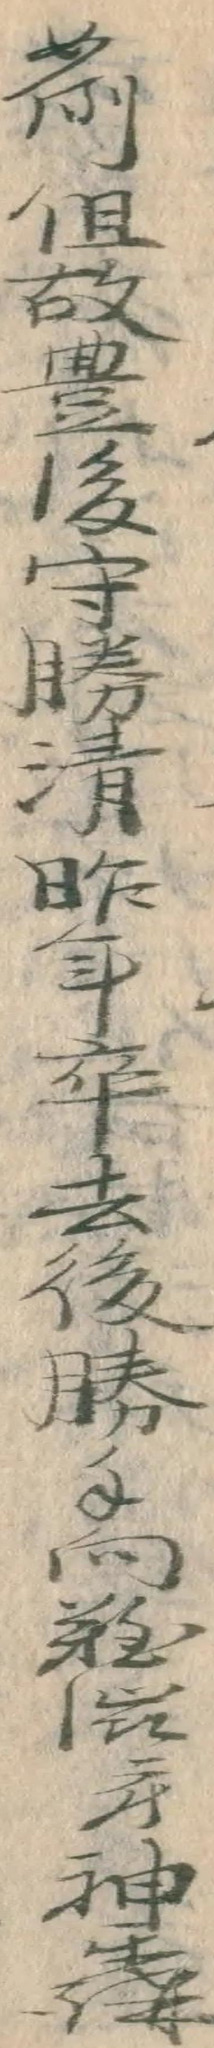如例但故豊後守勝清昨年卒去後勝手向難渋ニ付神楽講
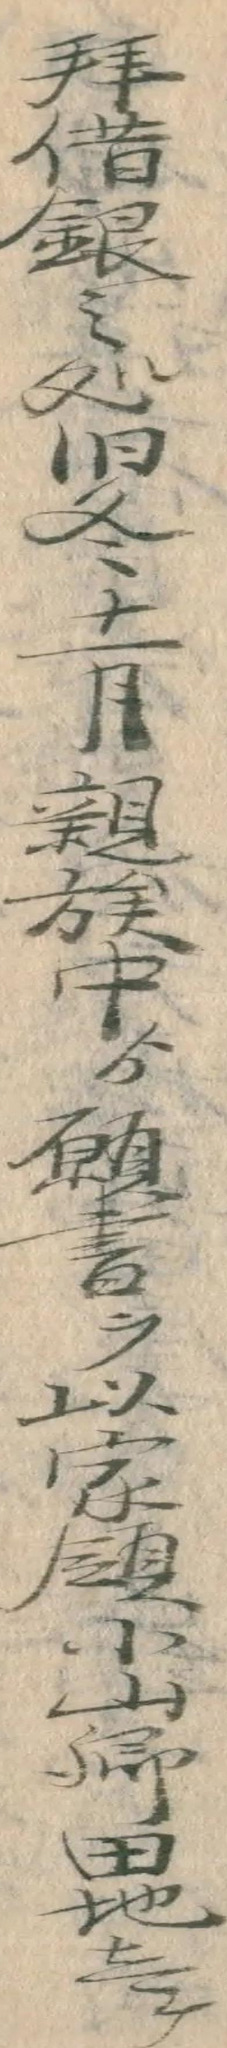拝借銀之処旧冬十一月親族中ゟ願書ヲ以家領小山郷田地壱ケ
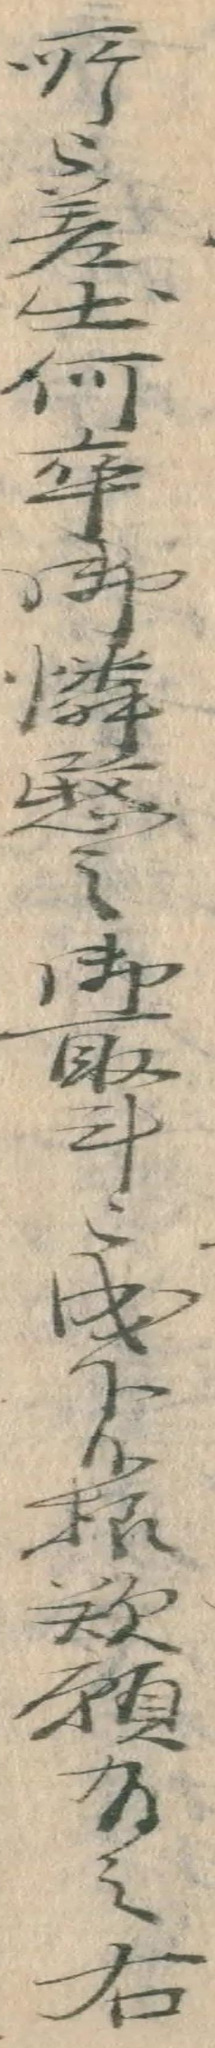所被差出何卒御憐愍之御取斗被成下候様歎願有之右
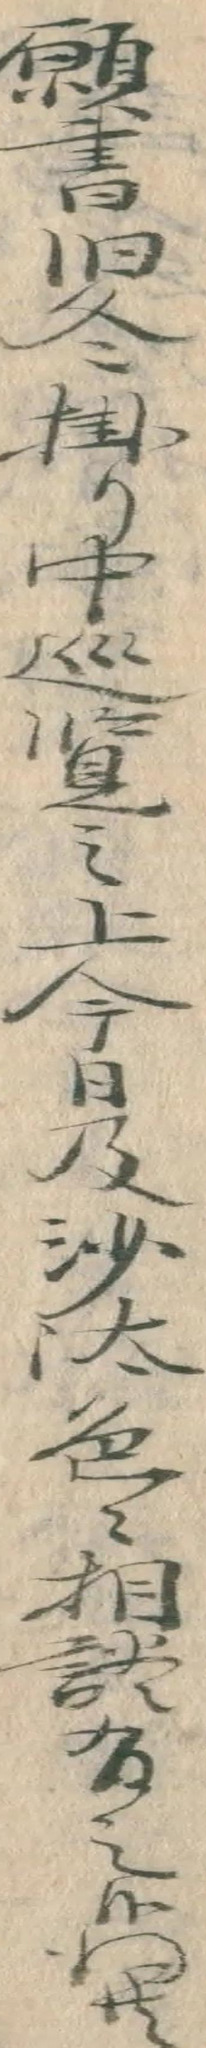願書旧冬掛リ中巡覧之上今日及沙汰色々相談有之候得共
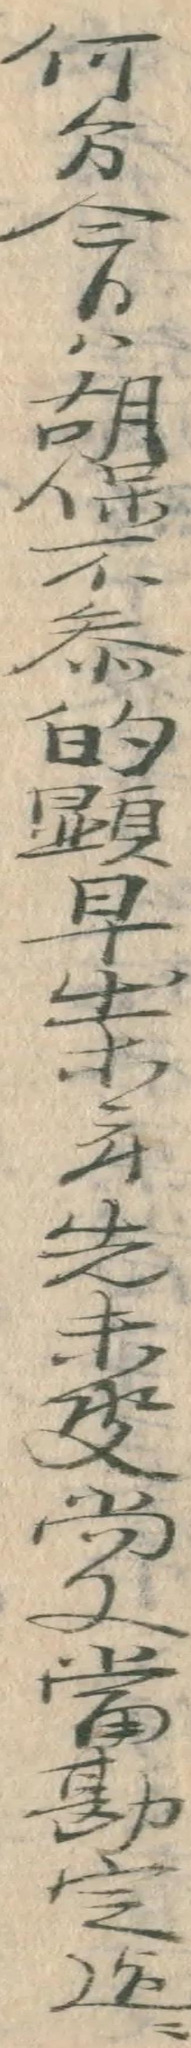何分今日ハ胡保不参的顕早出等ニ付先未決尚又當勘定迄ニ
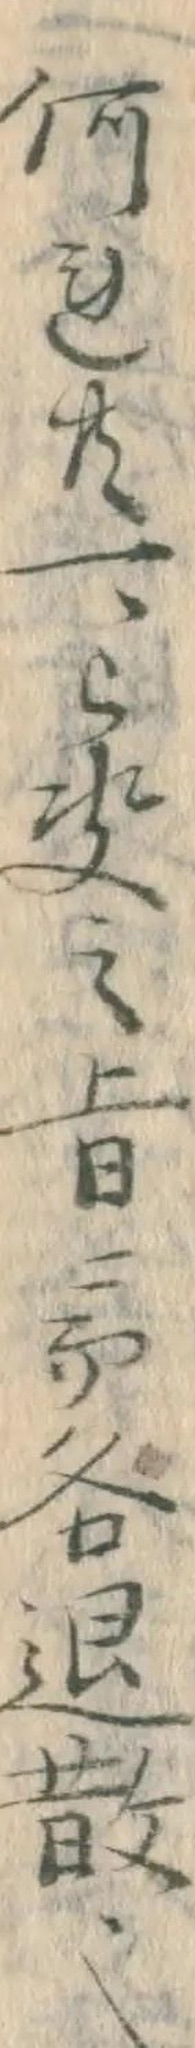何れ共可被決之旨ニ而各退散也
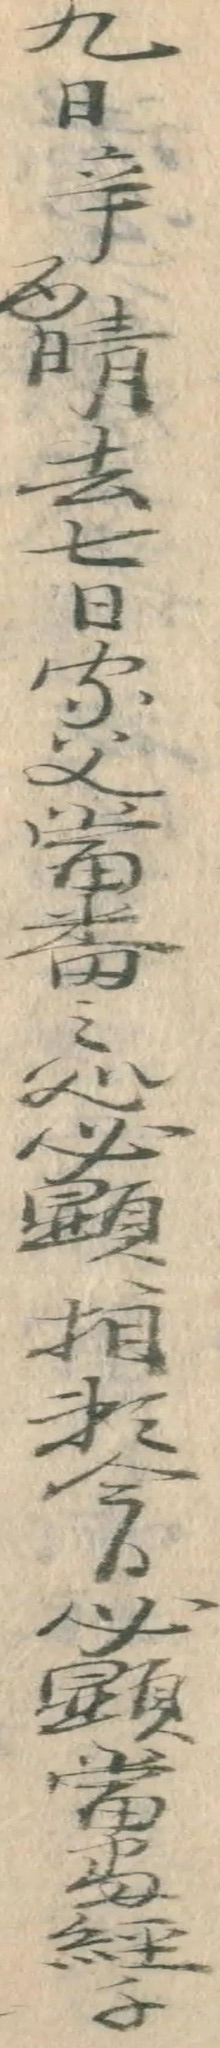九日辛卯晴去七日家父當番之処必顕へ相頼今日必顕當番経千
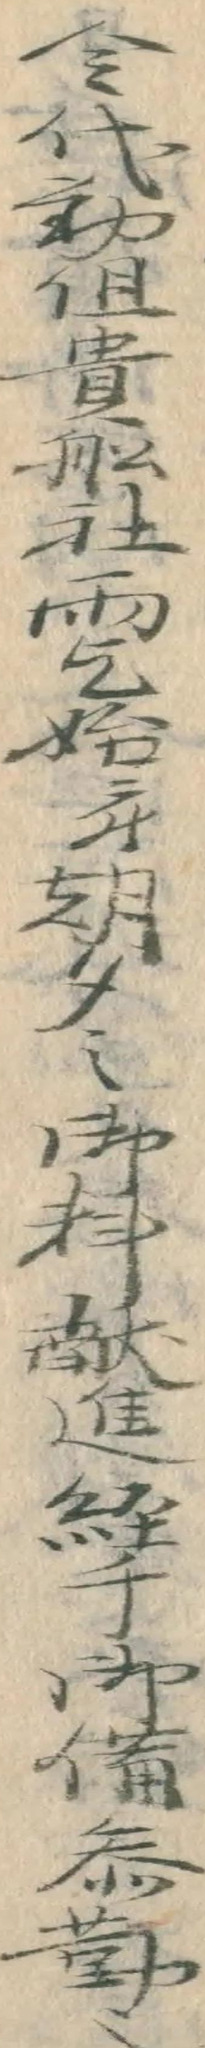令代勤但貴舩社雨乞始ニ付朝夕之御料献進経千御備参勤也

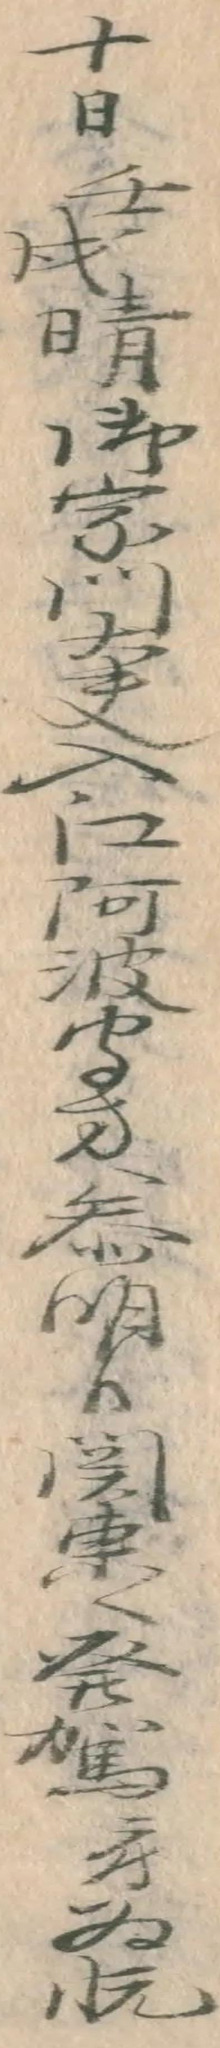十日壬戌晴御家門大夫入江阿波守方へ参明候関東へ発駕ニ付為祝
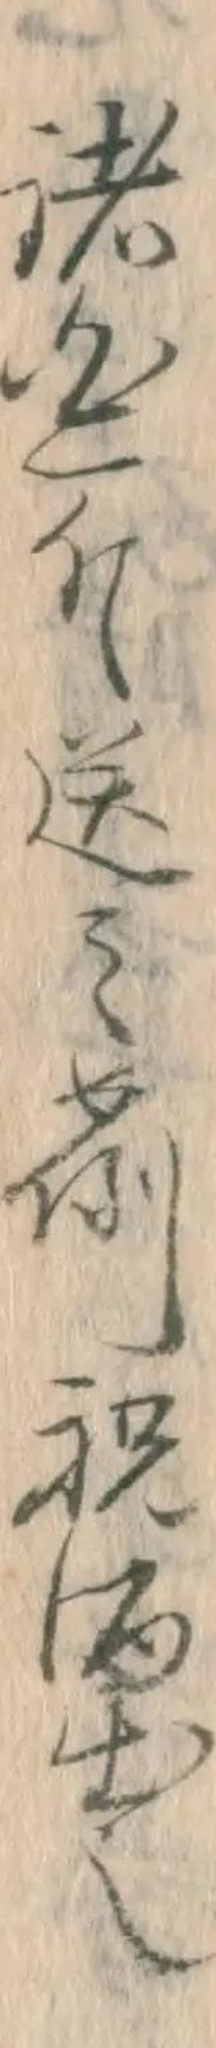諸国外送之如例祝酒出也
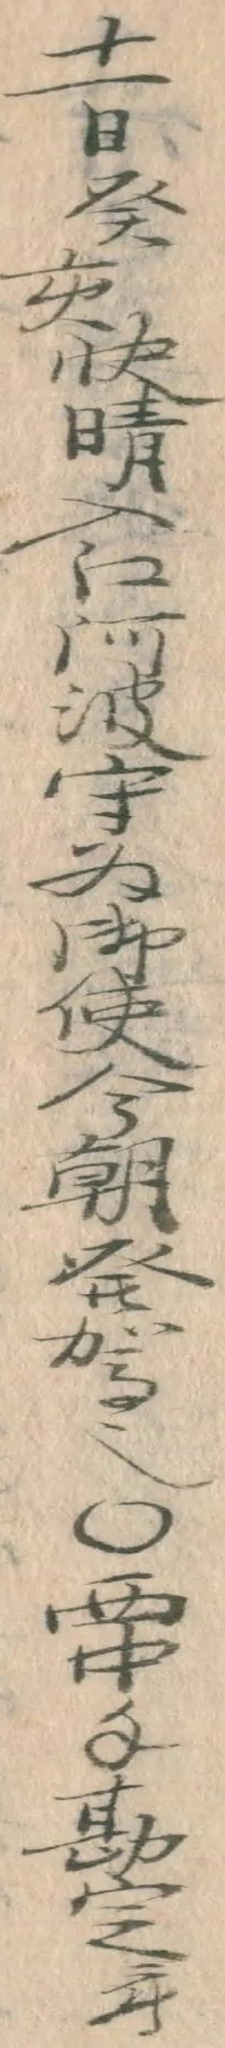十一日癸亥快晴入江阿波守為御使今朝発駕也○西中手勘定ニ付
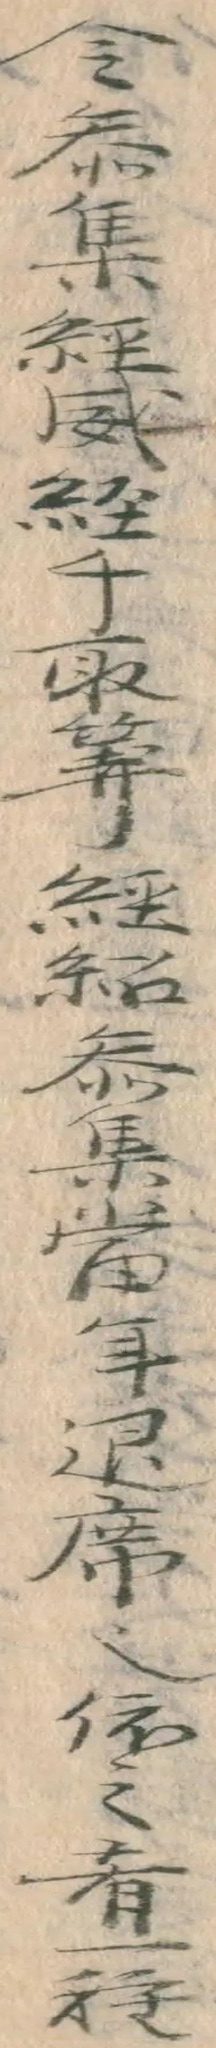令参集経威経千取算経紹参集當年退席也依之肴一種
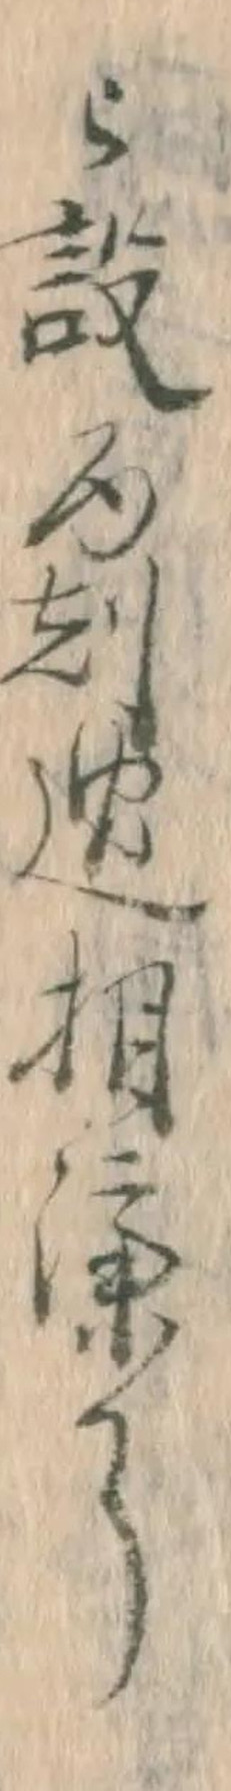被設酉刻過相添了
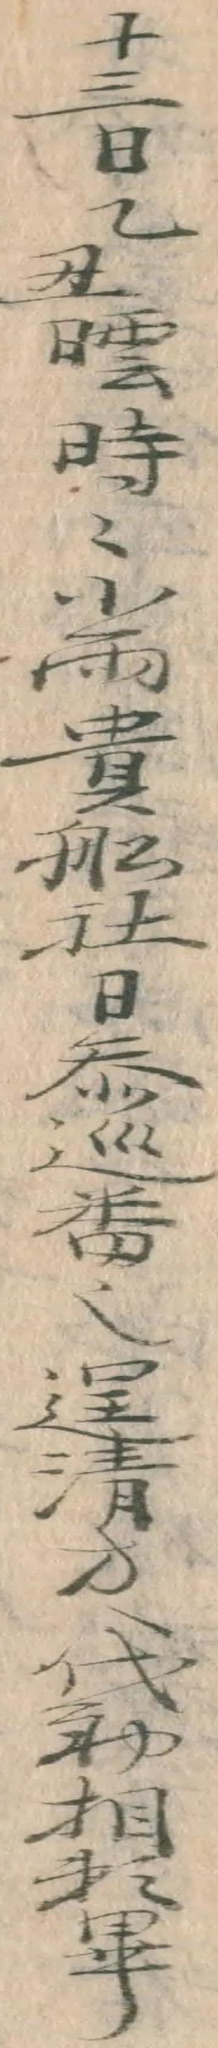十三日乙丑曇時々小雨貴舩社日参巡番也逞清方へ代勤相頼畢
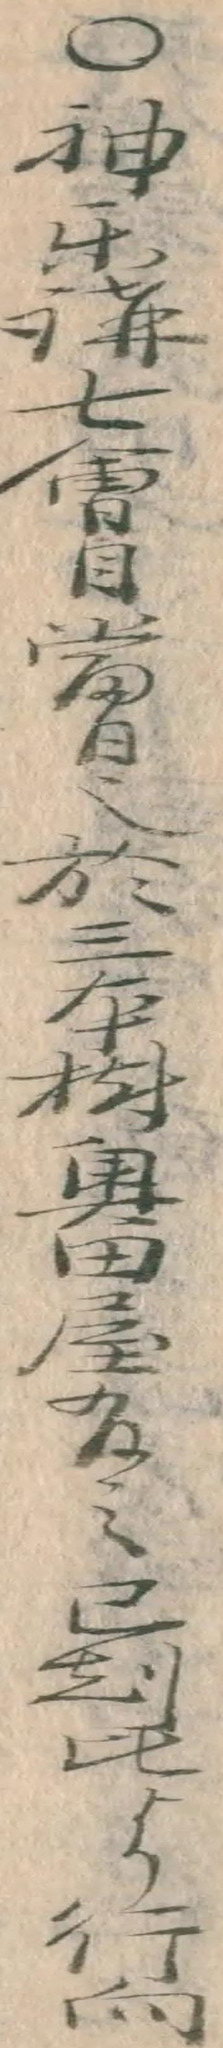○神楽講七會目當日也於三本樹奥田屋有之已刻比より行向
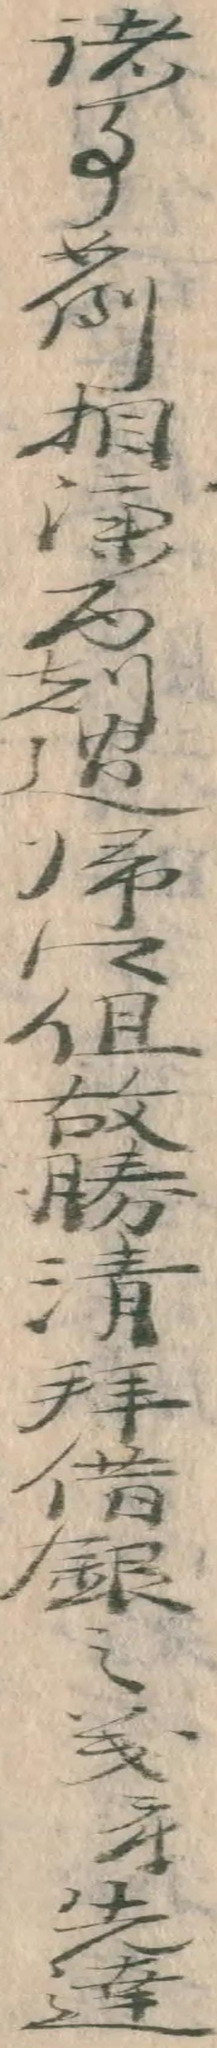諸事如例相済酉刻過帰郷但故勝清拝借銀之義ニ付先達
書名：賀茂社記録. 第65冊
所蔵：国立国会図書館 National Diet Library, JAPAN
